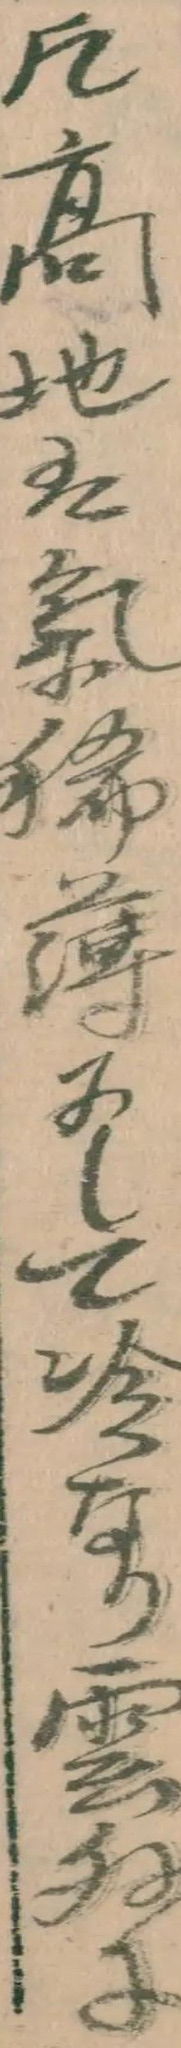凡高地は気稀薄にして冷なり雲多に
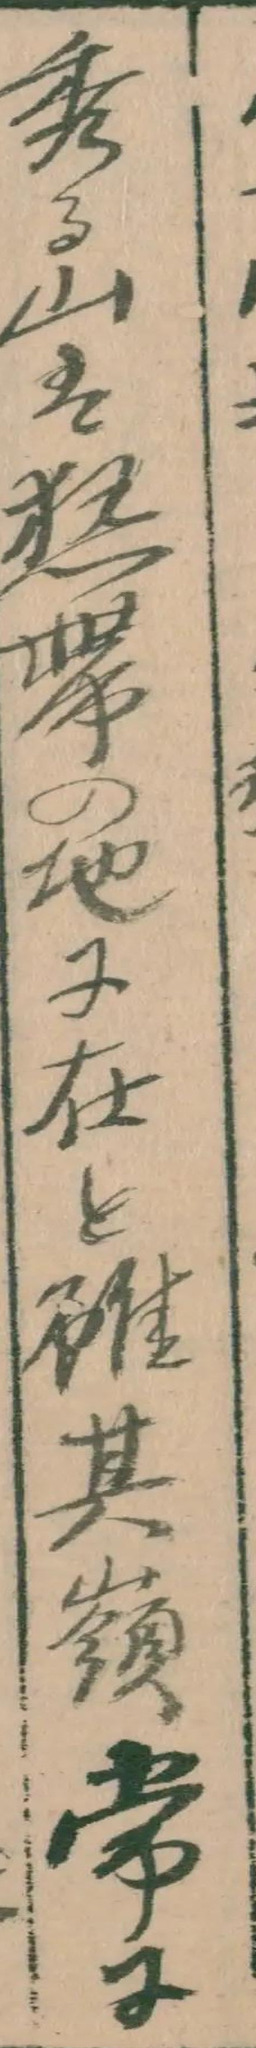秀る山は熱帯の地に在と雖其嶺常に
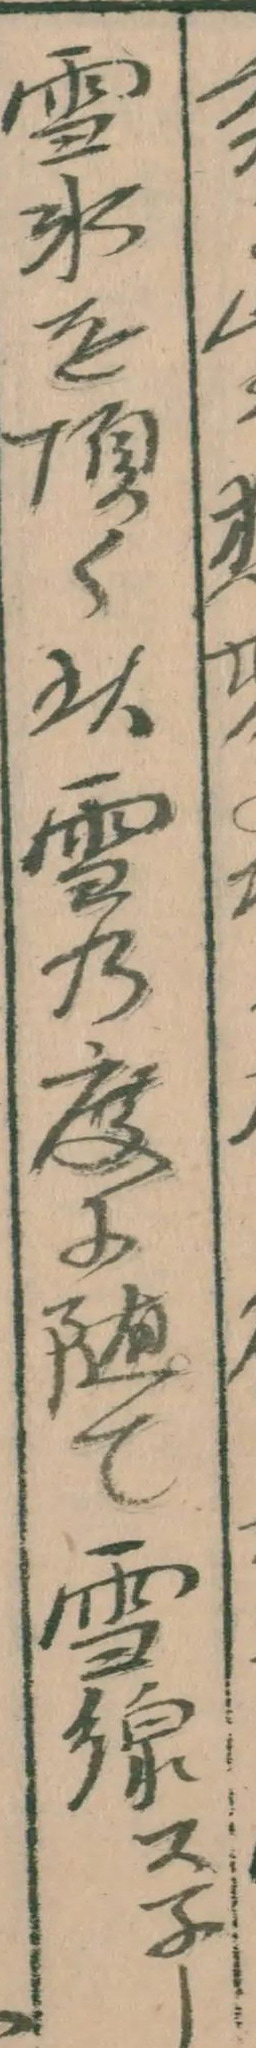雪氷を頂く此雪の度に随て雪線スネー
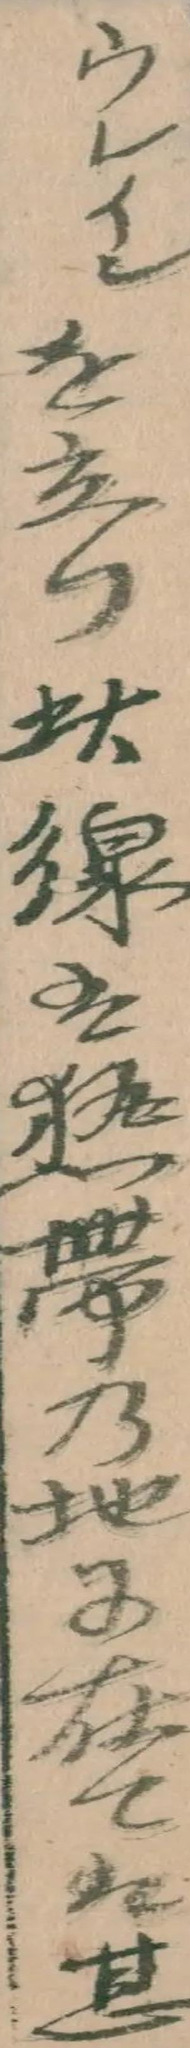ウレインを立り此線は熱帯の地に在ては甚
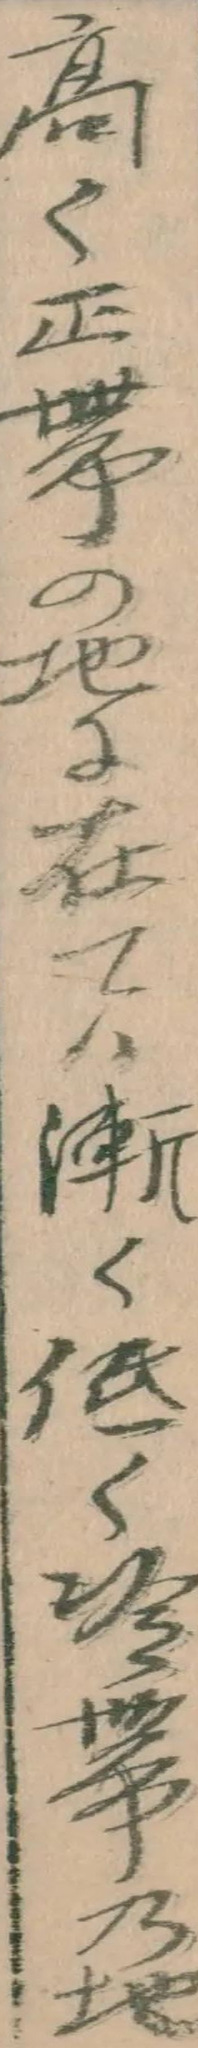高く正帯の地に在ては漸く低く冷帯の地
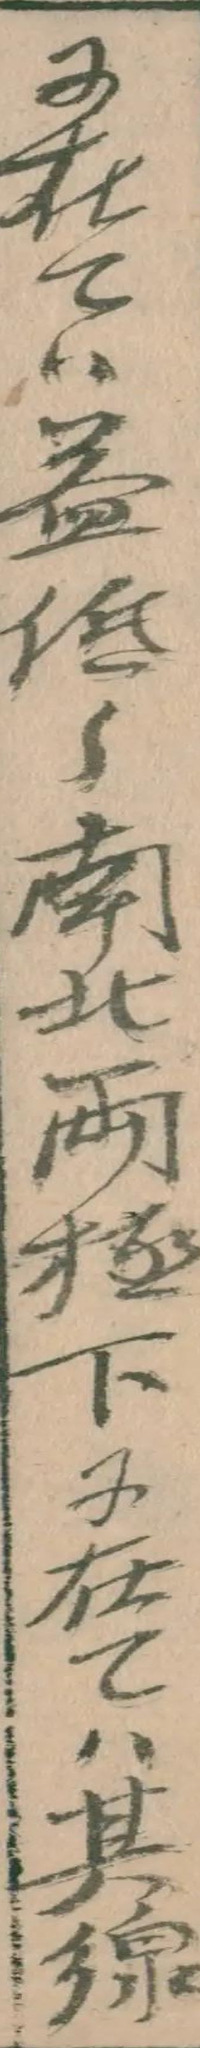に在ては益低く南北両極下に在ては其線
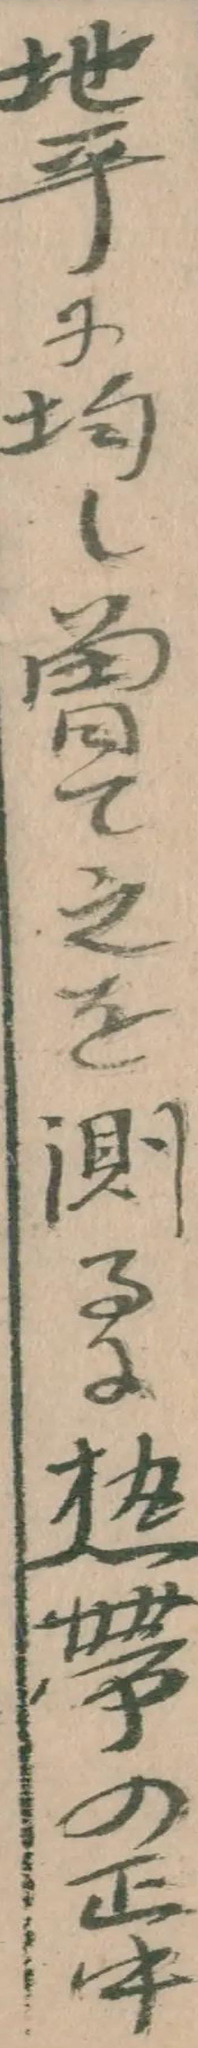地平に均し曽て之を測るに熱帯の正中
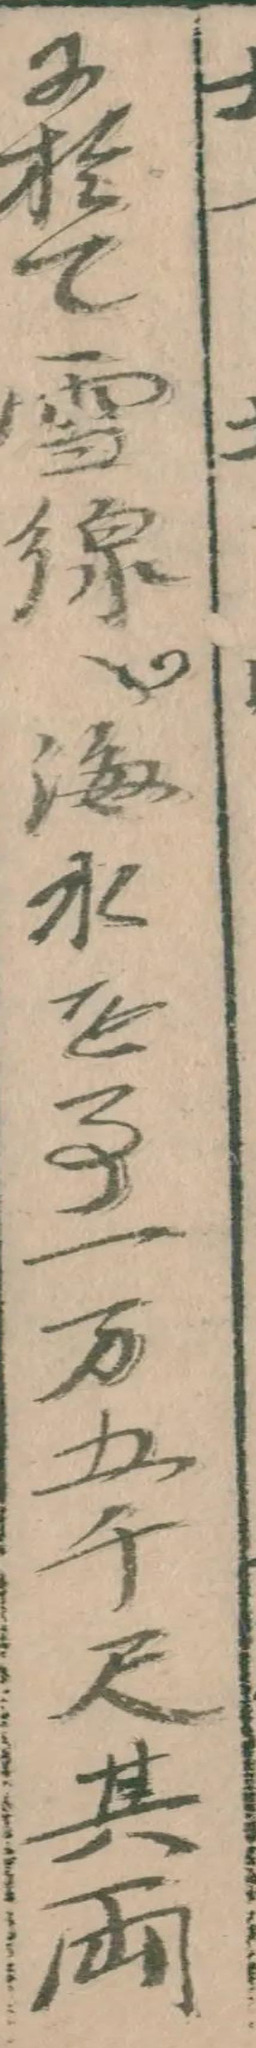に於て雪線海水を事一万五千尺其両
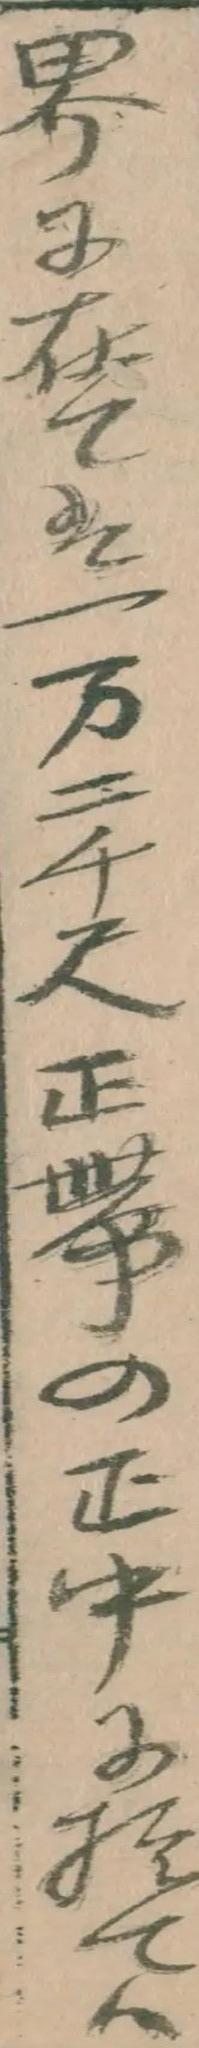界に在ては一万二千尺正帯の正中に於ては

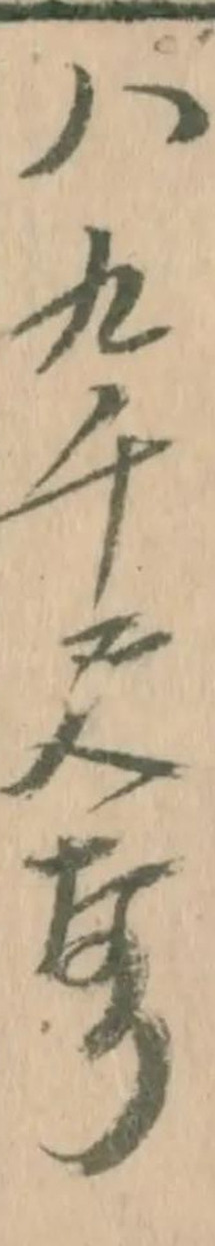八九千尺なり
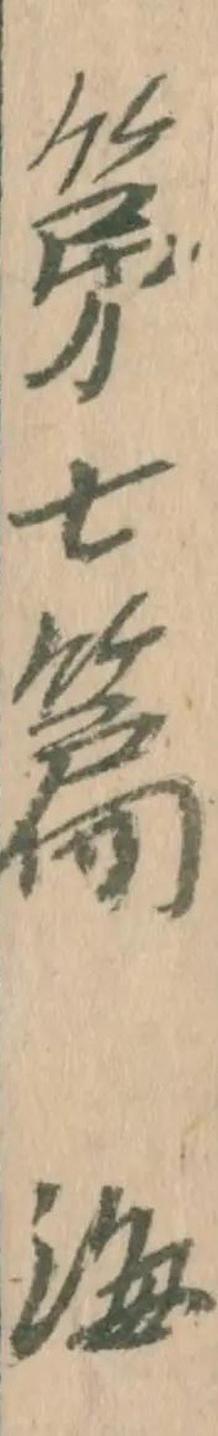第七篇海
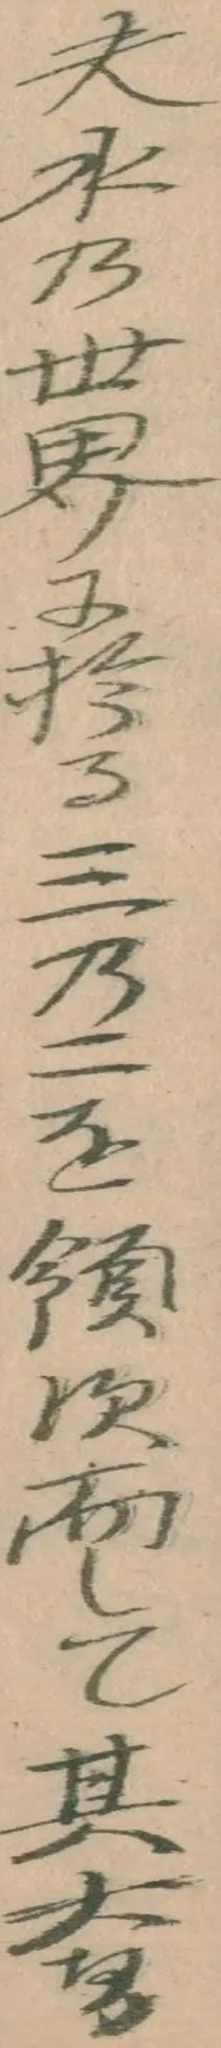夫水の世界に於る三の二を領す而して其大なる
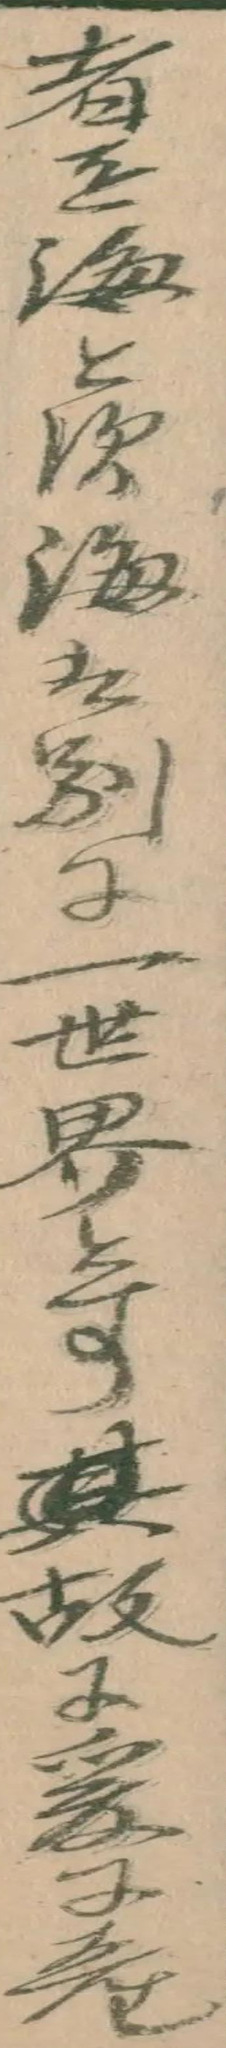者を海とす海は別に一世界とす故に爰に
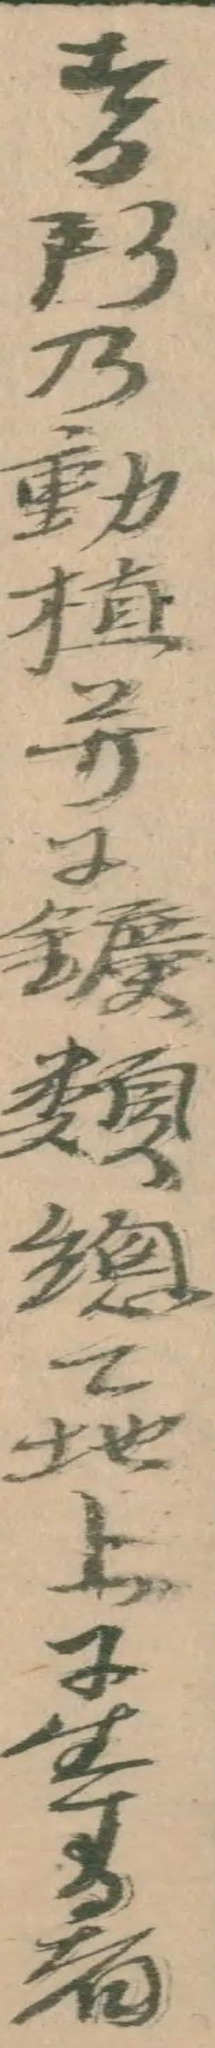する所の動植并に鉱類総て地上に生する者
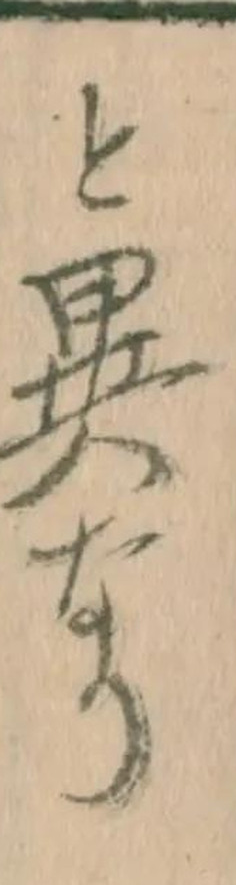と異なり
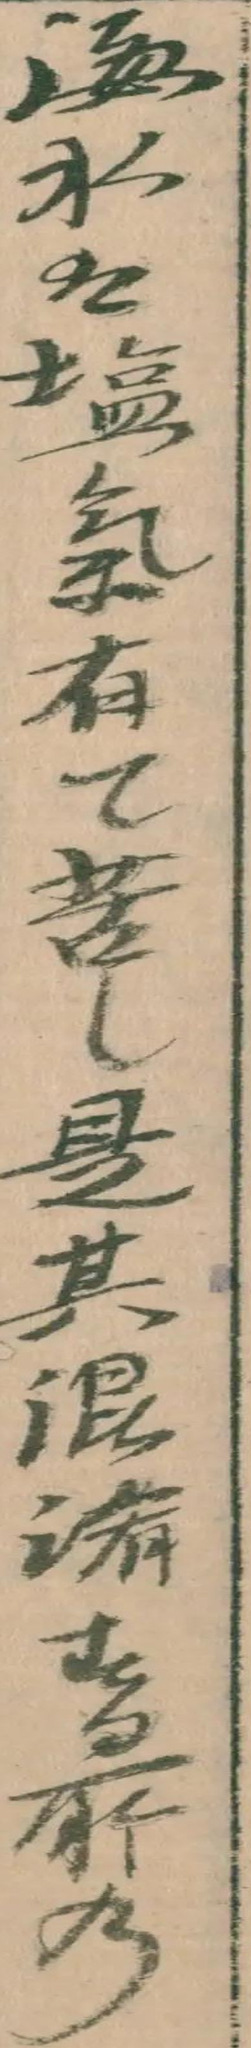海水は塩気有て苦し是其混淆する所の
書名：新釈輿地図説
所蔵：国立国会図書館 National Diet Library, JAPAN
